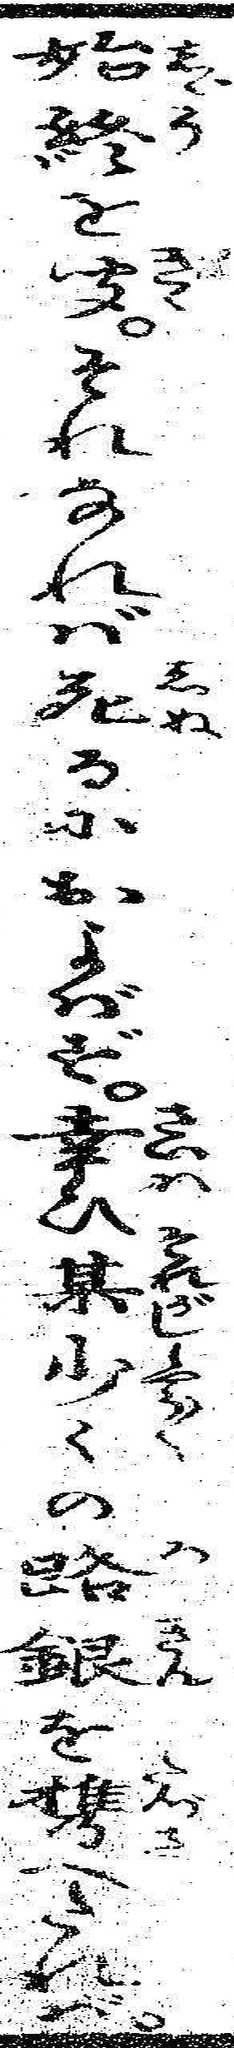始終を聞。それなれば死るにおよばず。幸ひ某少々の路銀を携へたれば。
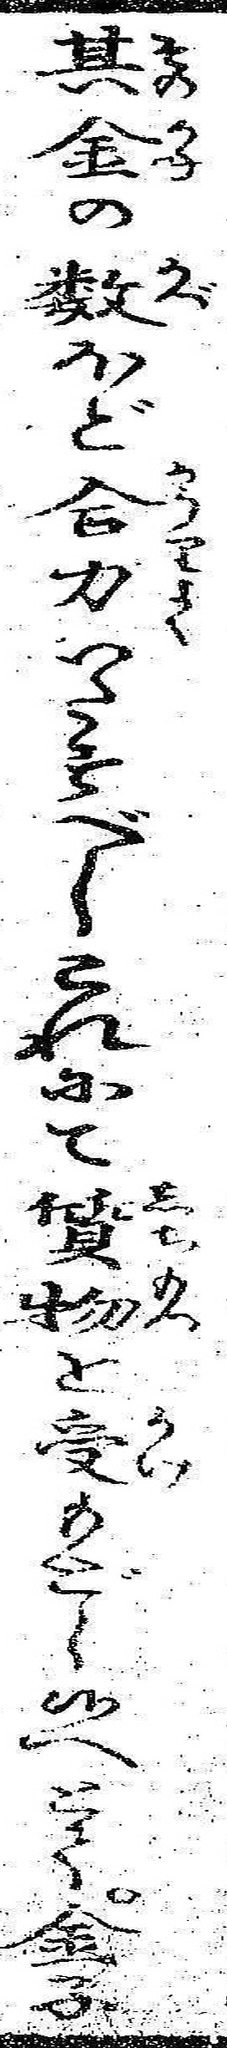其金の数ほど合力いたすべしこれにて質物を受もどし候へとて。金子
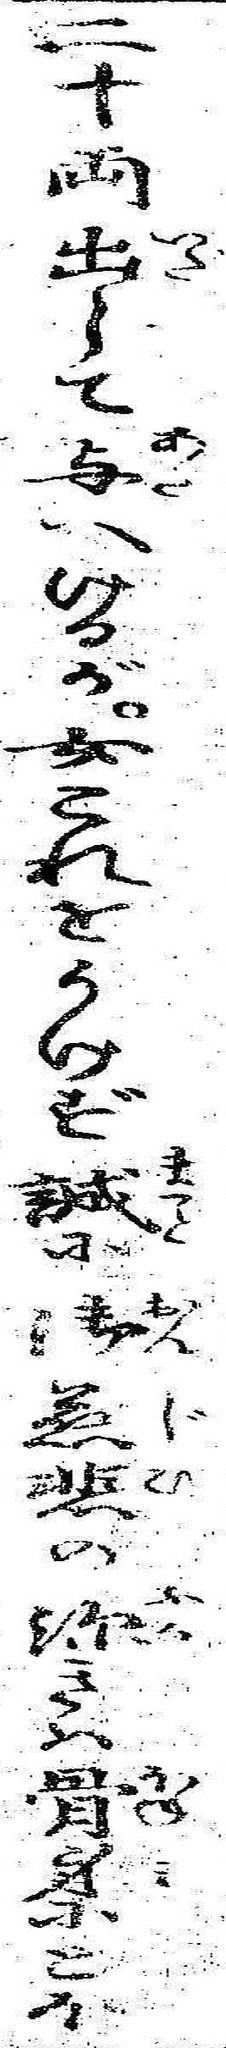二十両出して与へけるが。女これをうけず誠に御慈悲の深きは骨身にとほ
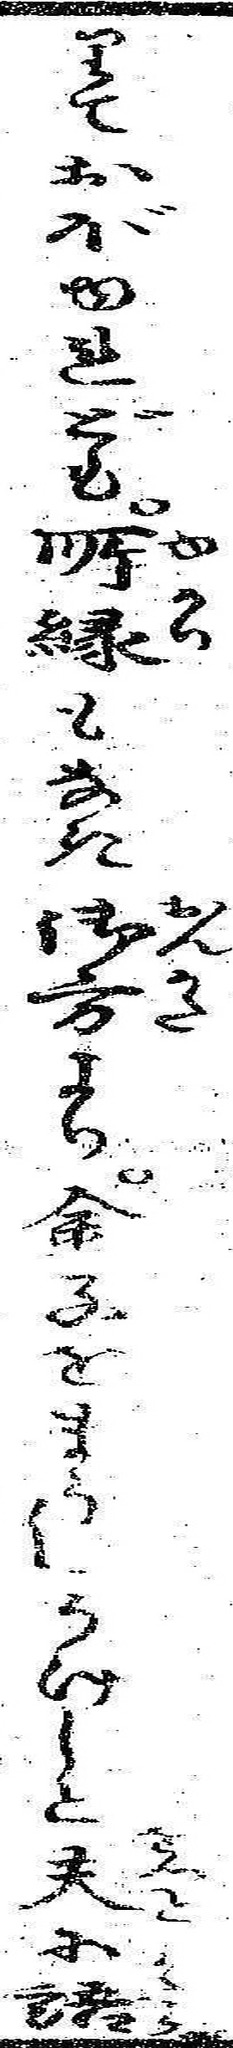りておぼゆれども。所縁もなき御方より。金子をまうしうけしと夫に語
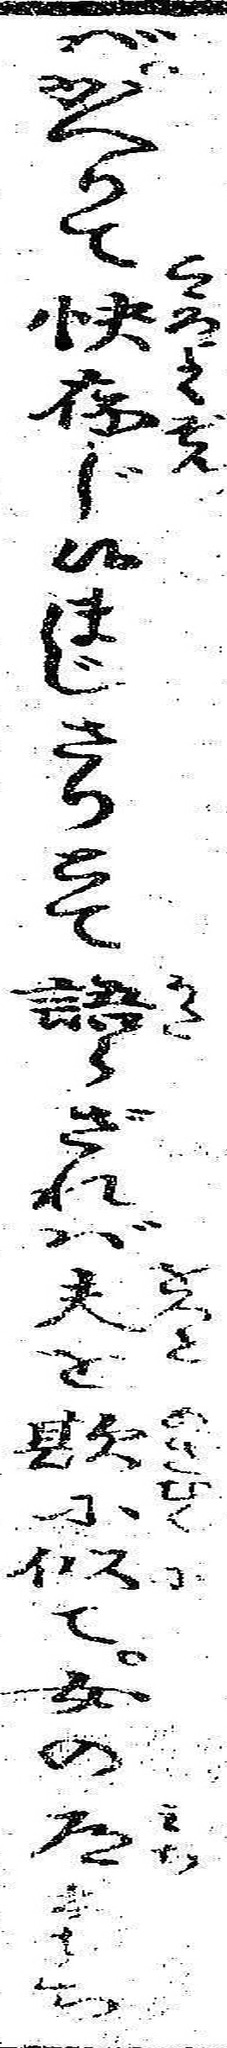ば。かへりて快存じ候まじさりとて語らざれば夫を欺に似て。女の道ち
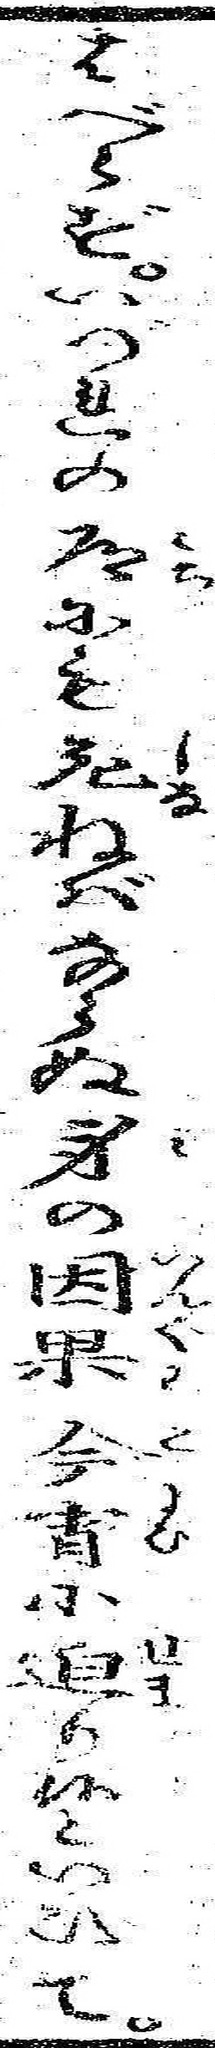はべらず。いづれの道にも死ねばならぬ身の因果今宵に迫り候といひて。
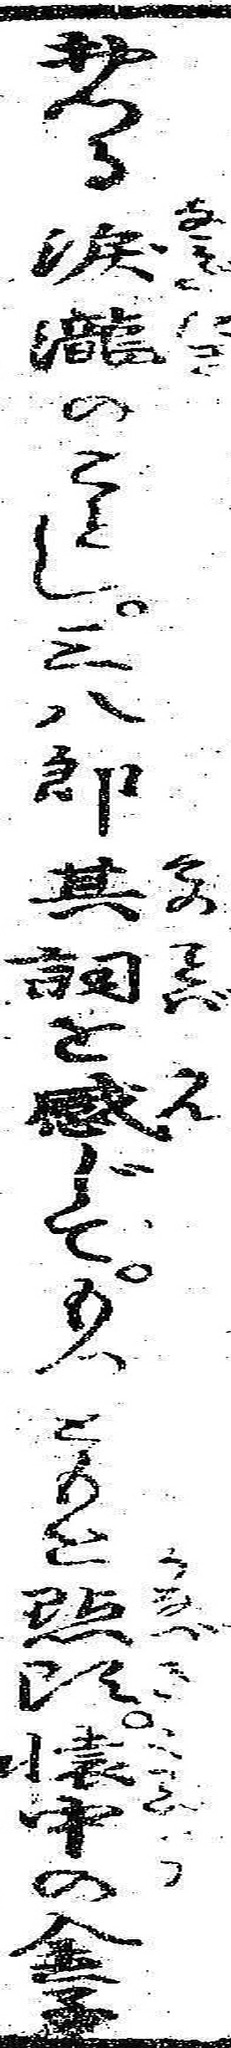おつる涙滝のごとし。三八郎其詞を感じて。もつともと点頭。懐中の金子
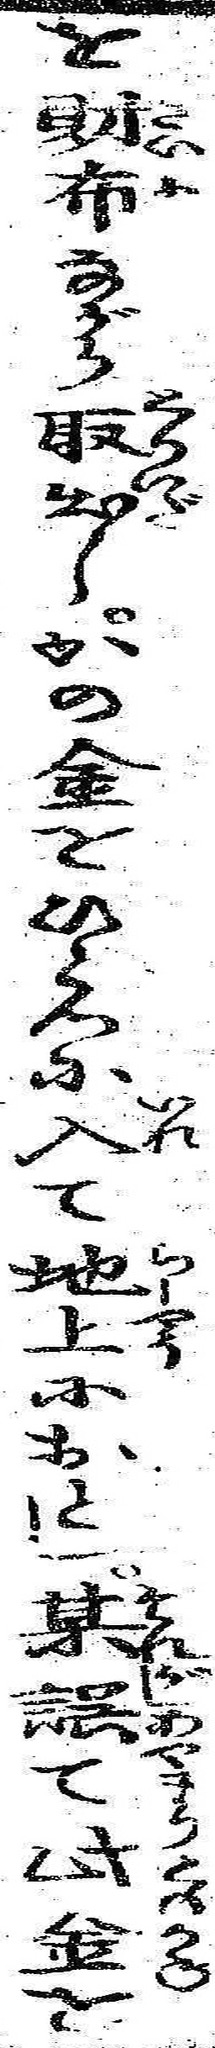を財布ながら取出し。かの金をひとつに入て地上におとし。某誤て此金を
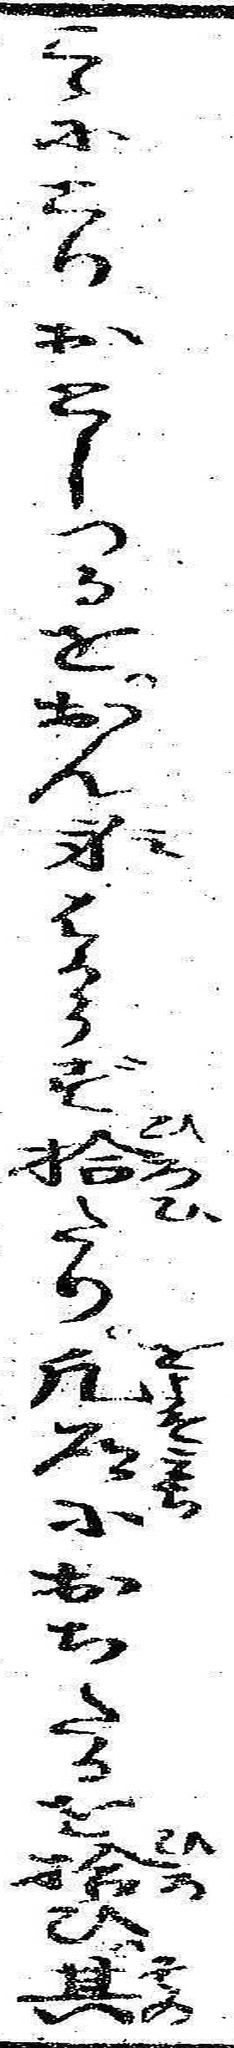こゝにとりおとしつるを。おん身はからず拾たり。凡道におちたるを拾ひ。其
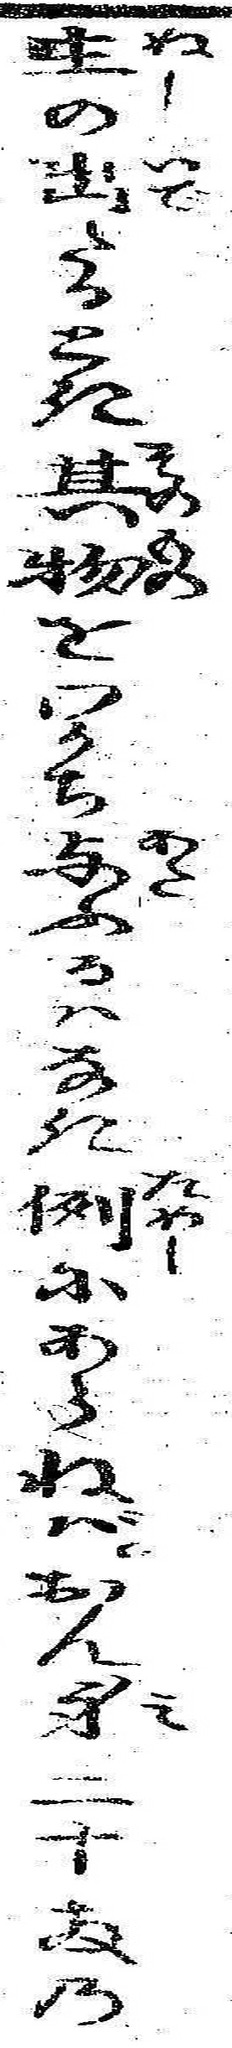主の出たるとき其物をわかち与ふるはなき例にあらねば。おん身二十両の
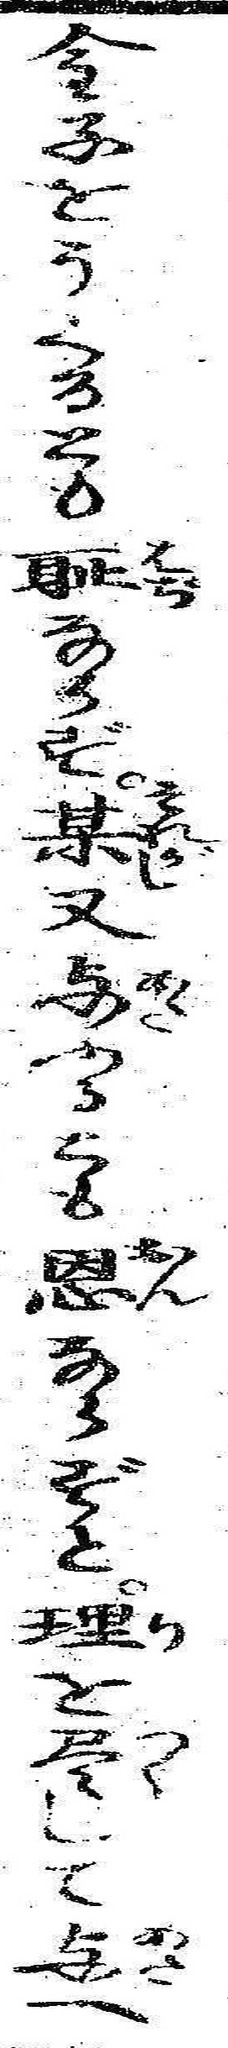金子をうくるとも恥ならず。某又与ふるとも恩ならずと。理を尽して与へ
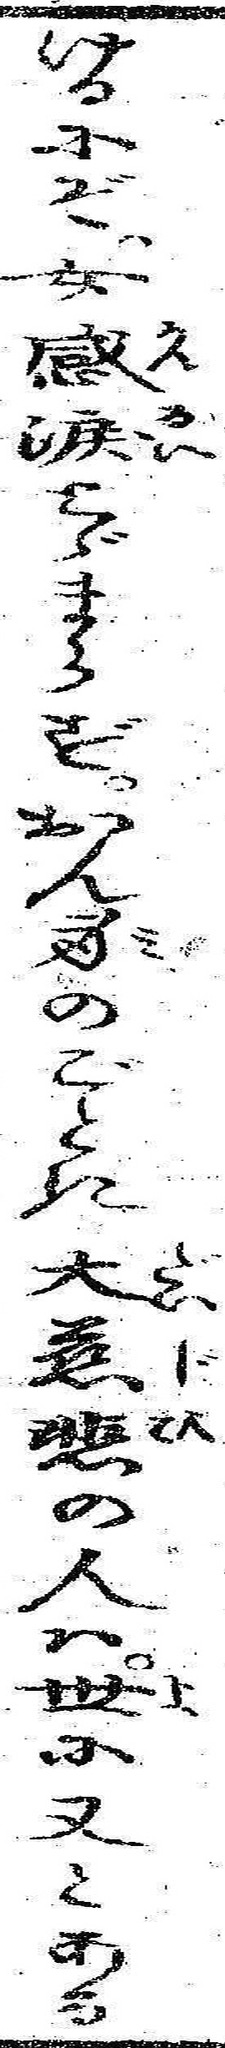けるにぞ。女感涙とゞまらず。おん身のごとき大慈悲の人は。世に又とある
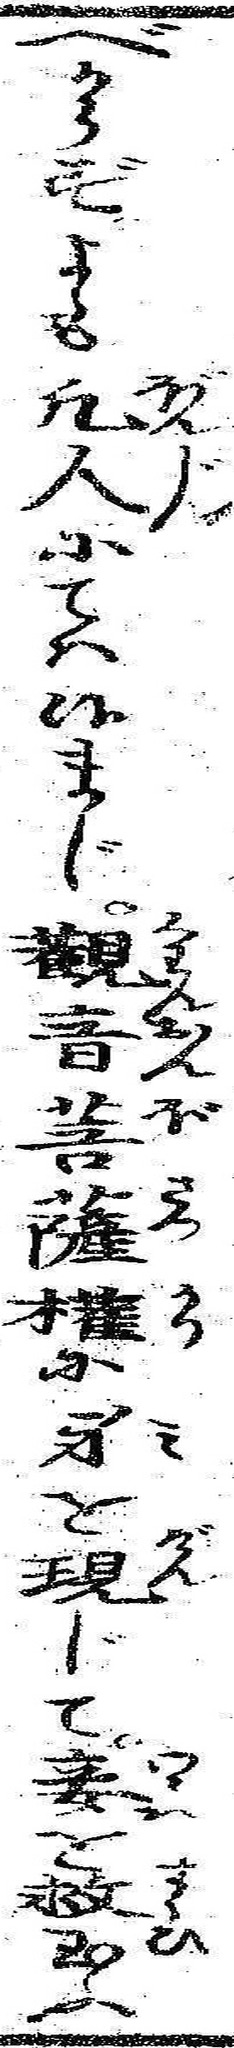べからず。よも凡人にては候まじ。観音菩薩権に身を現じて。妾を救玉ふ
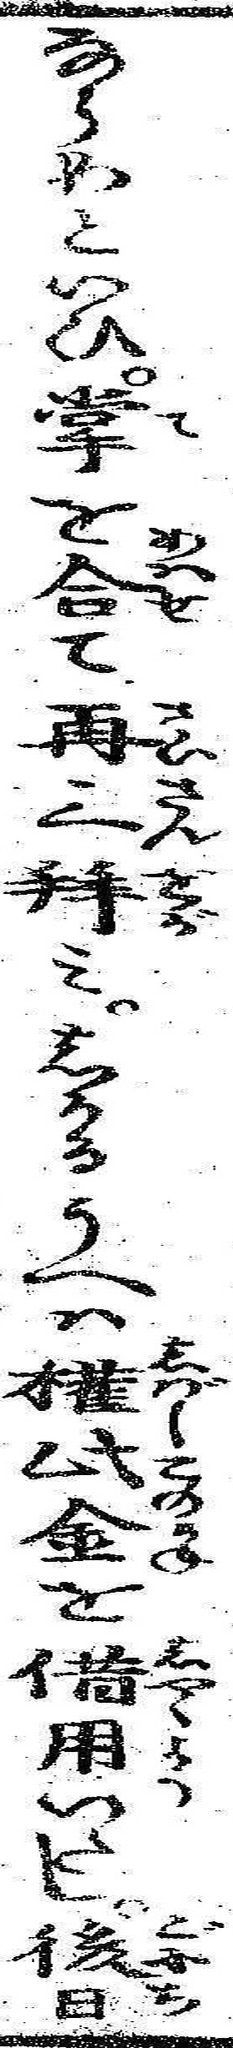ならめといひ。掌を合て再三拝み。しかるうへは権此金を借用いたし。後日
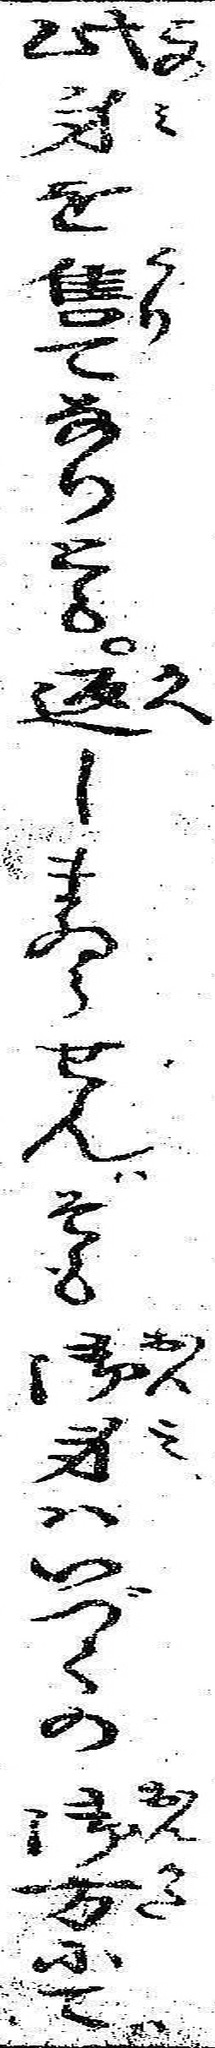此身を售てなりとも。返しまゐらせん。そも御身はいづくの御方にて。
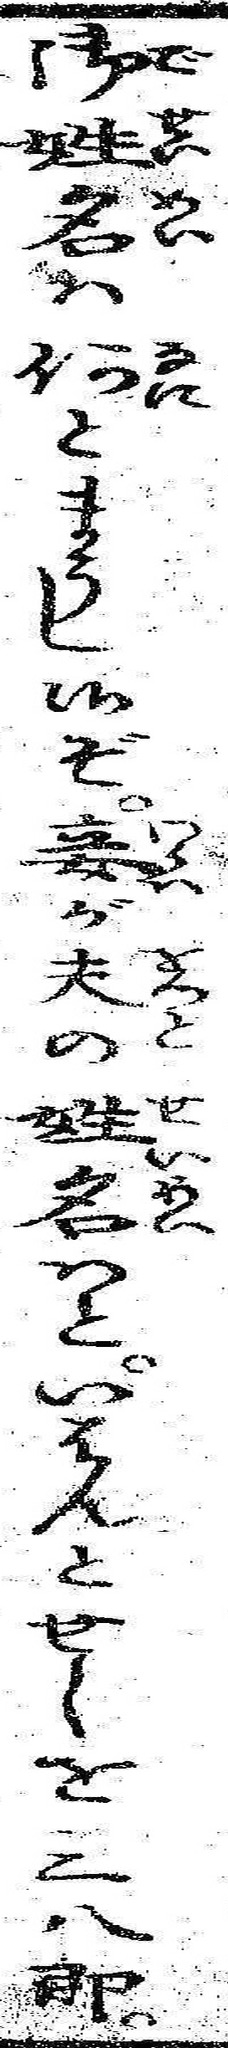御姓名は何とまうし候ぞ。妾が夫の姓名はと。いはんとせしを三八郎。
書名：昔話稲妻表紙
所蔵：国文学研究資料館
